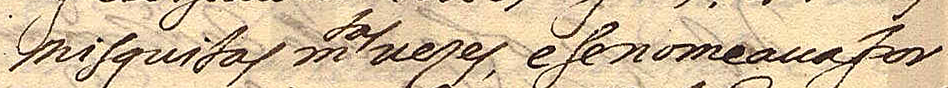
misquitas mtas uezes, e se nomeaua por
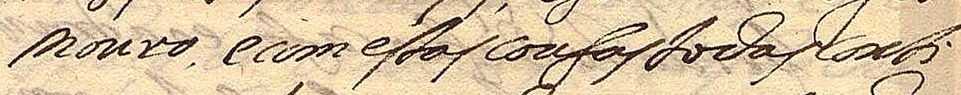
mouro, e com estas cousas todas conti
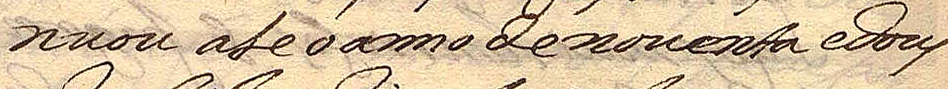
nuou ate o anno de nouenta e dous
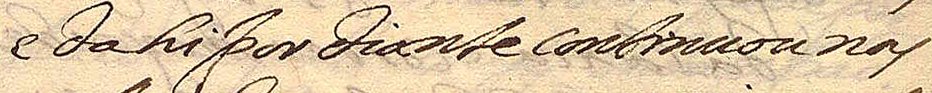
e dahi por diante continuou nas
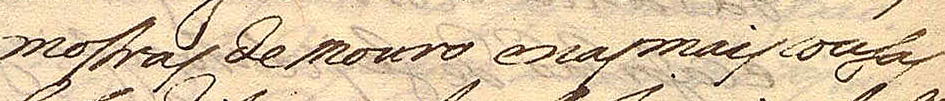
mostras de mouro e nas mais cousas
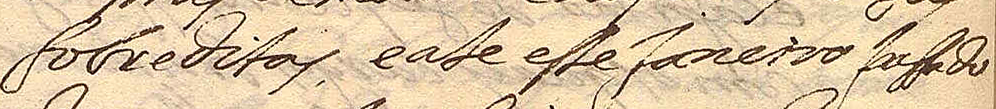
sobreditas, e ate este Janeiro passado
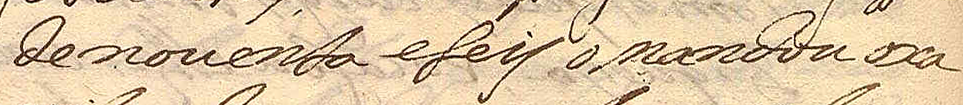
de nouenta e seis o mandou o xa
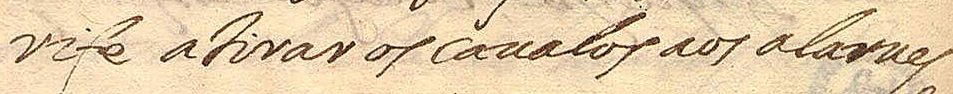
rife a tirar os caualos aos alarues
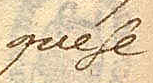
que se
